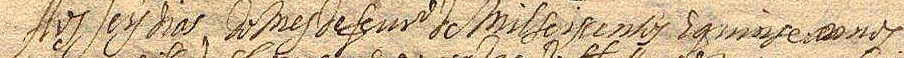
Aos Seis dias do mes de feuro de Mil seiscentos E quinse annos
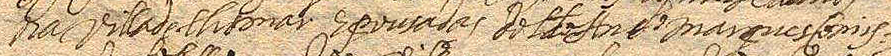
na Villa de thomar E pousadas do Ldo Anto marques Comis
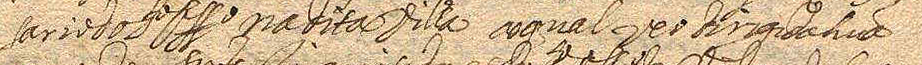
sario do Sto Offo na dita Villa ao qual veo dirigido huā
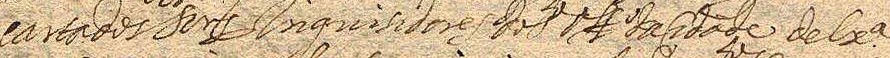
carta dos Sors̄ Inquisidores do Sto Offo da Cidade de lx.a
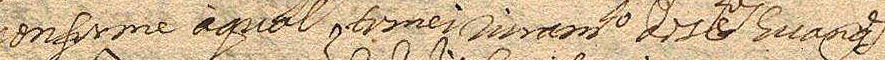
conforme à qual tomei iuramto dos stos Euangos
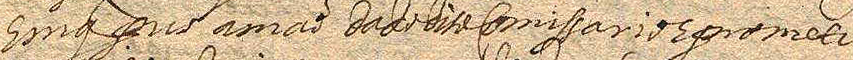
Em a q̄ pus a maõ da do dito Comissario E prometi
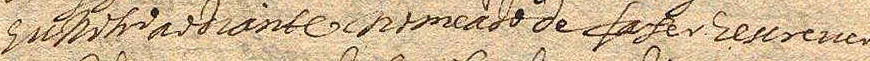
Eu Notro ao diante nomeado de faser E escreuer
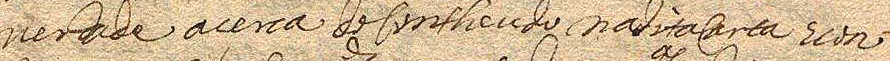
uerdade açerca do Contheudo na dita Carta E con
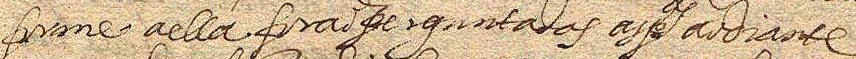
forme a ella foraõ perguntadas as pas ao diante
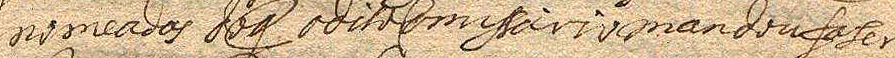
nomeadas do q̄ o dito Comissario mandou faser
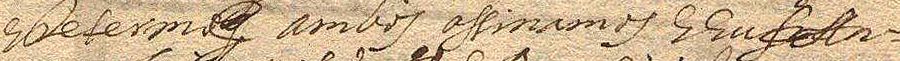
Este termo q̄ ambos assinamos E Eu fr An
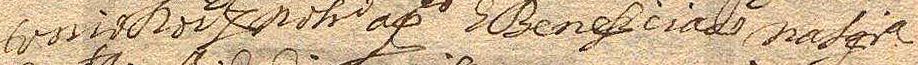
tonio Roiz notro apco E Beneficiado na Igra.
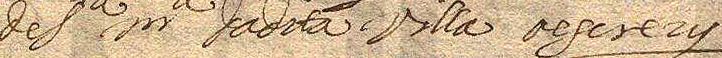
de Sta ma da dita Villa o escreuj
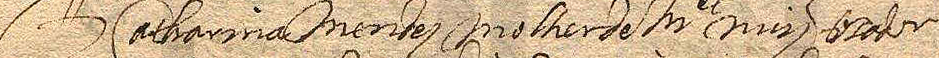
item Catharina mendes molher de mel nuis̄ tozador
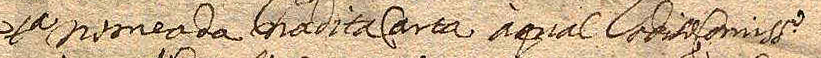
ta nomeada na dita Carta à qual o dito Comiss.o
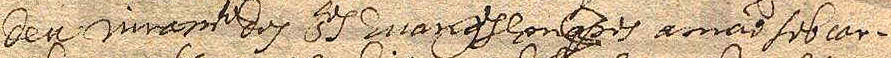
deu iuramto dos stos Euangos con q̄ pos a maõ sob car
